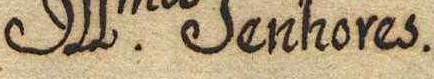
Ill.mos Senhores.
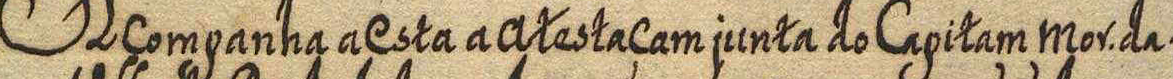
Acompanha a esta a atestaçam junta do Capitam mor. da
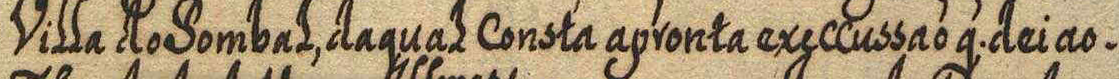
Villa do Pombal, da qual consta a pronta execcussaõ q̄. dei ao
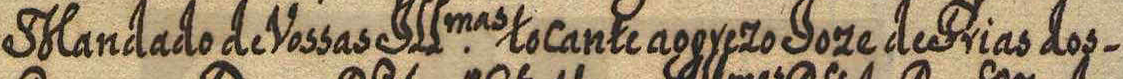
Mandado de Vossas Ill.mas tocante ao prezo Ioze de Frias dos
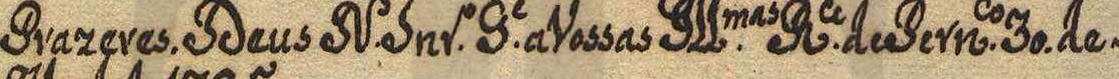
Prazeres, Deus N. Snr.o G.e a Vossas Ill.mas Rce. de Pern.co 30. de
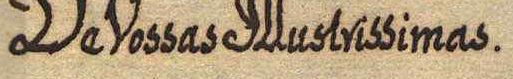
De Vossas Illustrissimas.
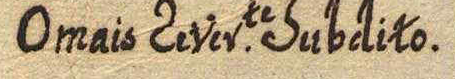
O mais Rever.te Subdito.
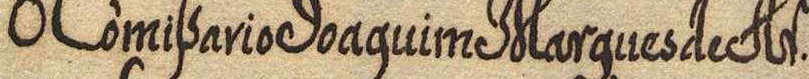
O Cōmissario Ioaquim Marques de Ar.o
